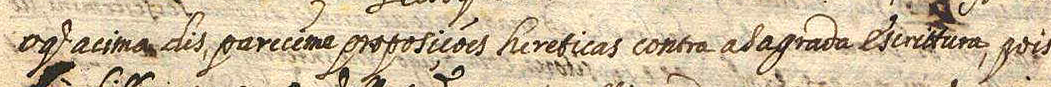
o q̄ acima dis, pareceme proposiçoẽs hereticas contra a Sagrada escrittura, pois
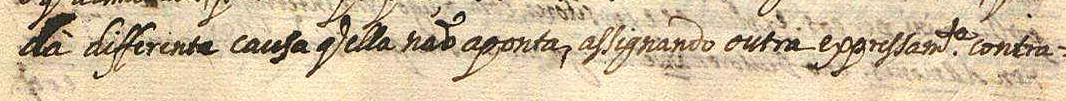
da differente causa q̄ ella naõ aponta, assignando outra expressam.te contra
